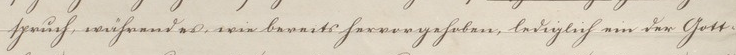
spruch, während es, wie bereits hervorgehoben, lediglich ein der Gott-
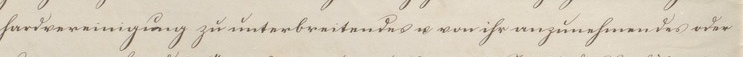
hardvereinigung zu unterbreitendes & von ihr anzunehmendes oder
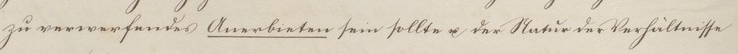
zu verwerfendes Anerbieten sein sollte & der Natur der Verhältnisse
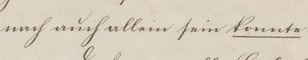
nach auch allein sein konnte.
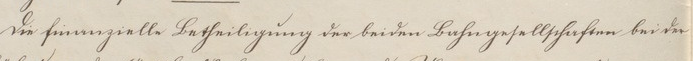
Die finanzielle Betheiligung der beiden Bahngesellschaften bei der
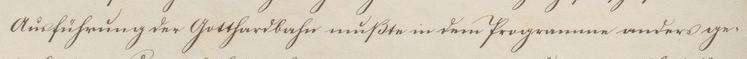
Ausführung der Gotthardbahn mußte in dem Programme anders ge-
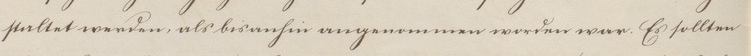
staltet werden, als bis anhin angenommen worden war. Es sollten
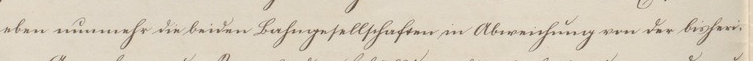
eben nunmehr die beiden Bahngesellschaften in Abweichung von der bisheri-
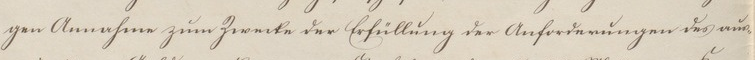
gen Annahme zum Zwecke der Erfüllung der Anforderungen des aus-
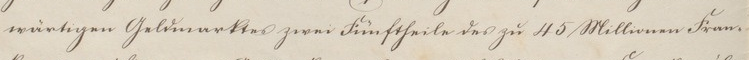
wärtigen Geldmarktes zwei Fünftheile des zu 45 Millionen Fran-
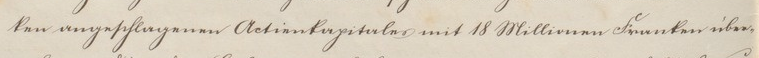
ken angeschlagenen Actienkapitales mit 18 Millionen Franken über-
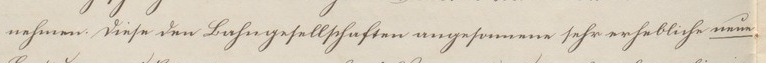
nehmen. Diese den Bahngesellschaften angesonnene sehr erhebliche neue
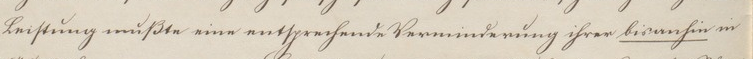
Leistung mußte eine entsprechende Verminderung ihrer bisanhin in
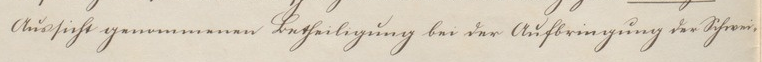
Aussicht genommenen Betheiligung bei der Aufbringung der Schwei-
